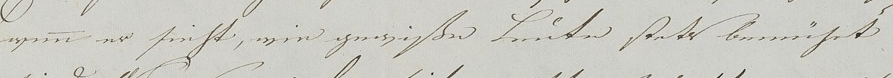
wenn er sieht, wie gewiße Leute stets bemühet
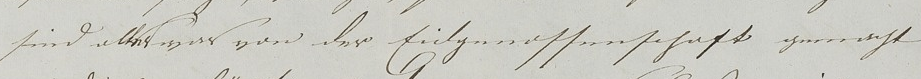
sind alles was von der Eidgenossenschaft gemacht
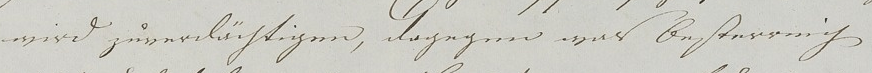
wird zuverdächtigen, dagegen was Oesterreich
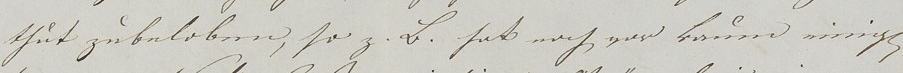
thut zubeloben, so z. B. hat noch vor kaum einigen
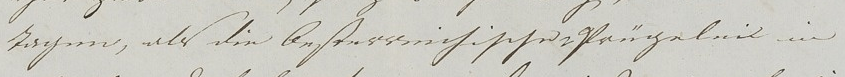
Tagen, als die Oesterreichische-Prügelei in
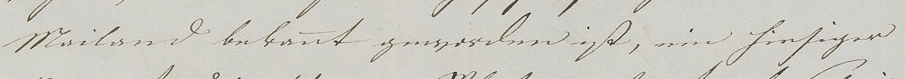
Mailand bekannt geworden ist, ein hiesiger
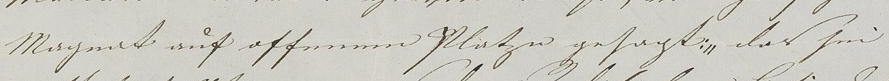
Magnat auf offenem Platze gesagt: «das sei
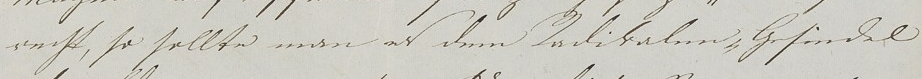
recht, so sollte man es dem Radikalen-Gesindel
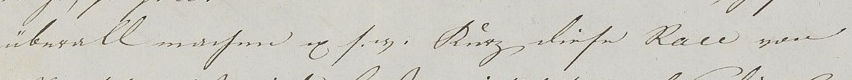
überall machen» &s. w. Kurz, diese Race von
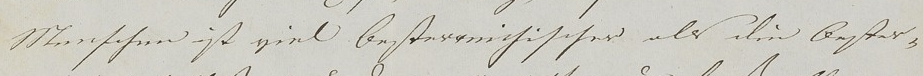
Menschen ist viel Oesterreichischer als die Oester-
